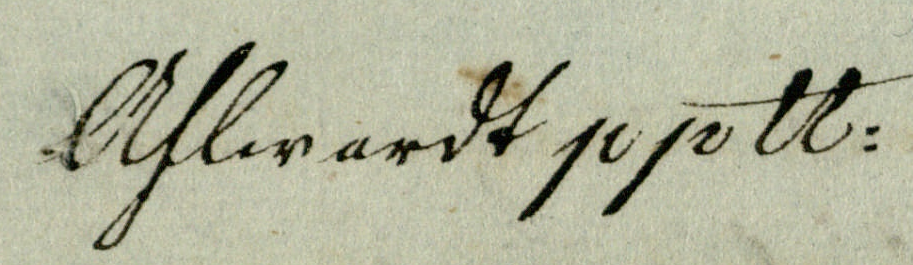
Ahlwardt pptt:
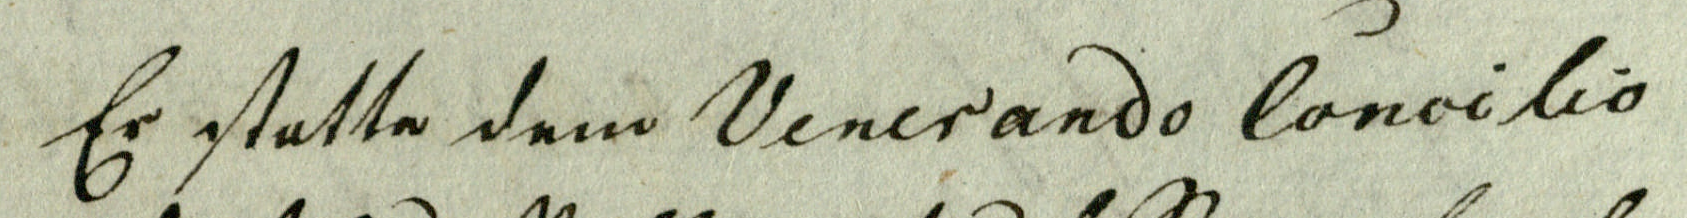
Er statte dem Venerando Concilio
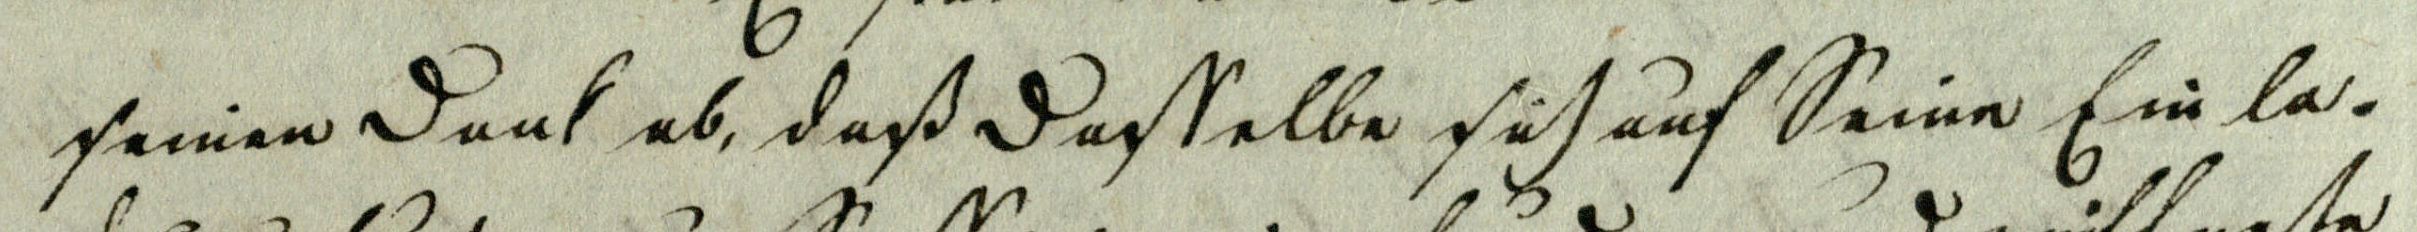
seinen Dank ab, daß dasselbe sich auf Seine Einla¬
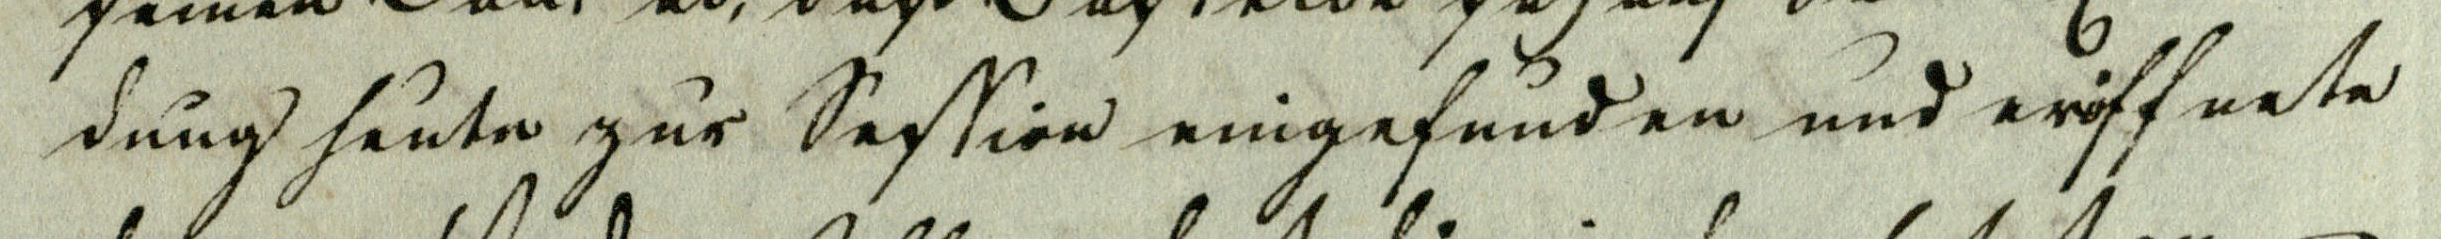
dung heute zur Session eingefunden und eröffnete
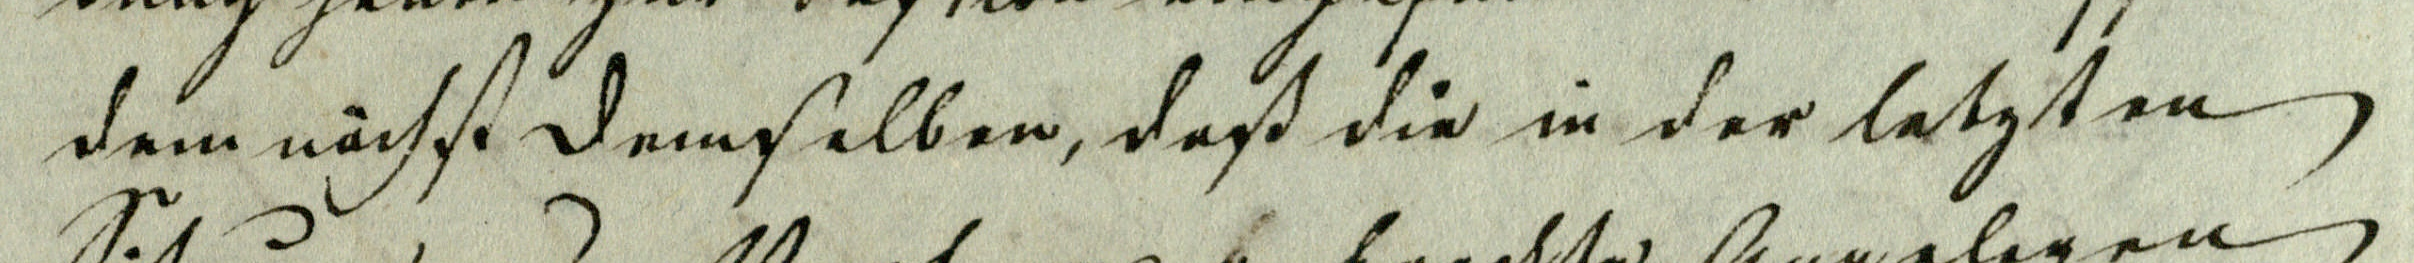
dem nächst demselben, daß die in der letzten
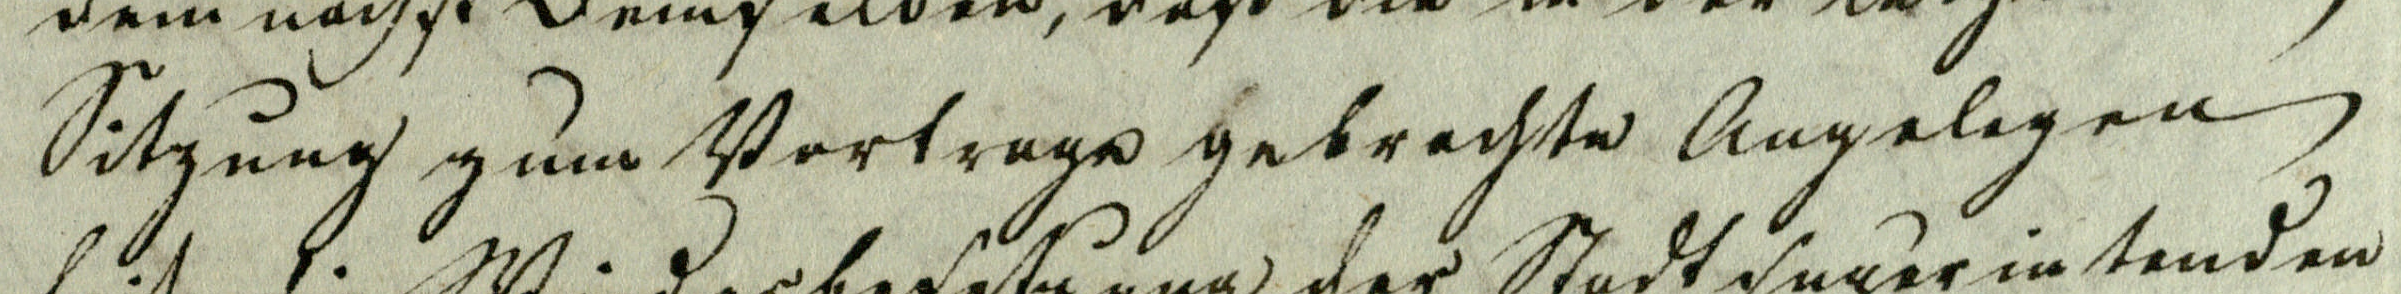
Sitzung zum Vortrage gebrachte Angelegen¬
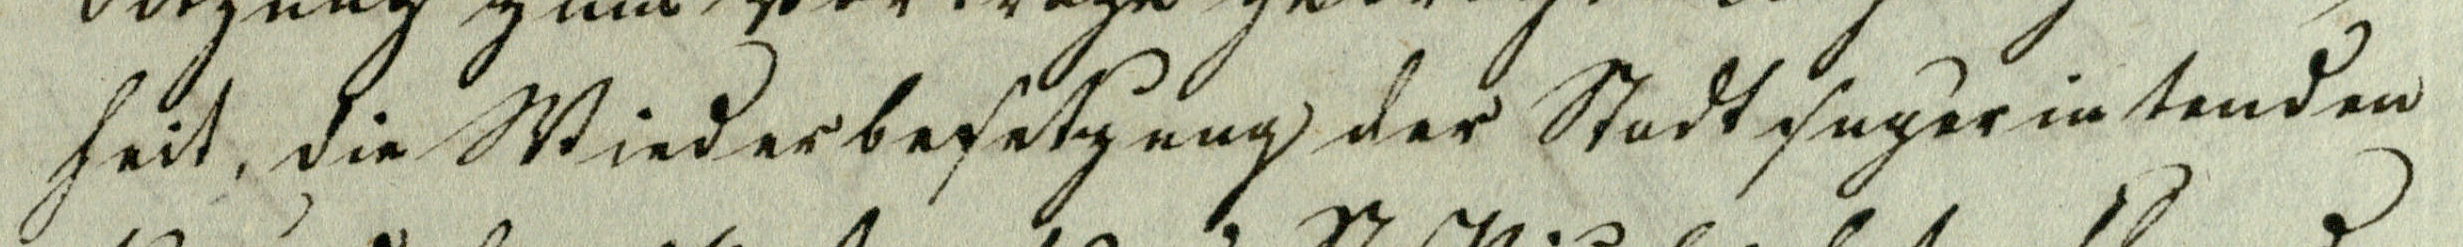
heit, die Wiederbesetzung der Stadt superintenden¬
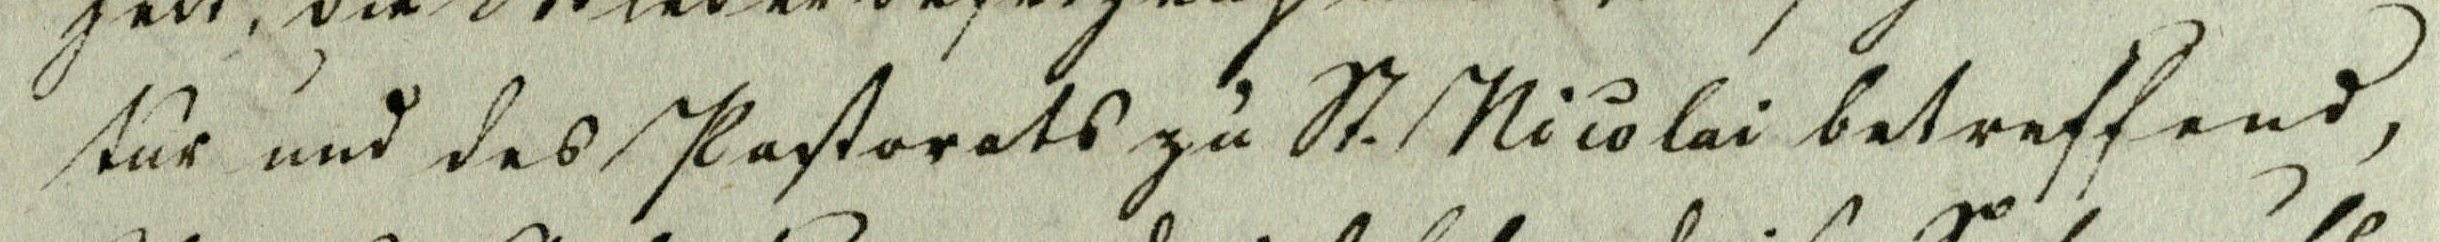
tur und des Pastorats zu St. Nicolai betreffend,
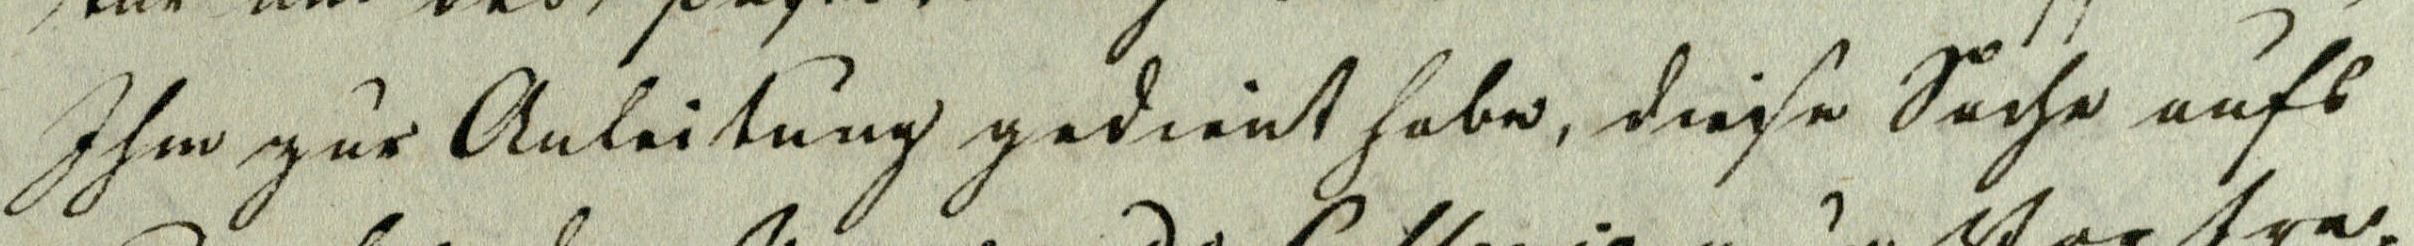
Ihm zur Anleitung gedient habe, diese Sache aufs
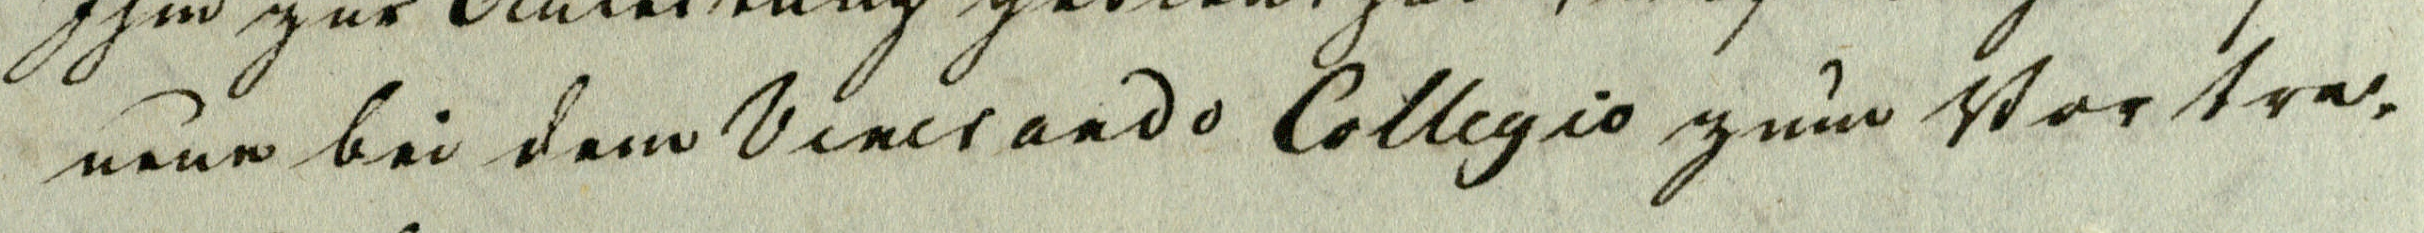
neue bei dem Venerando Collegio zum Vortra¬
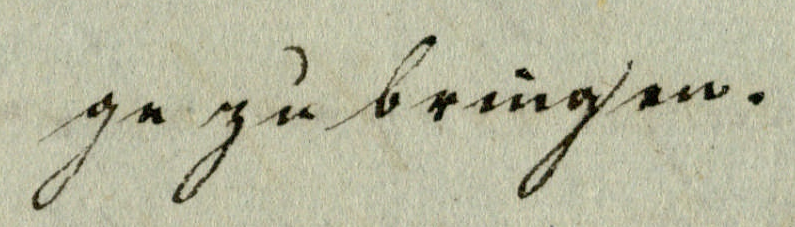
ge zu bringen.
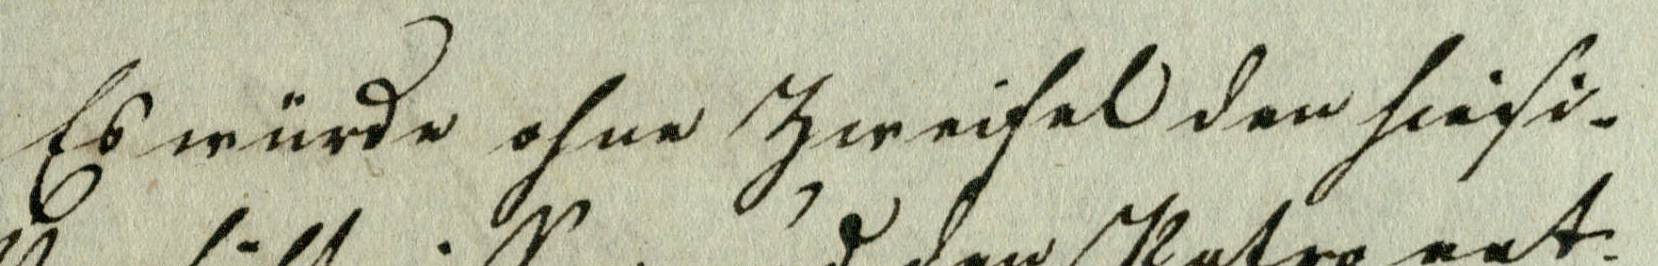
Es würde ohne Zweifel den hiesi¬
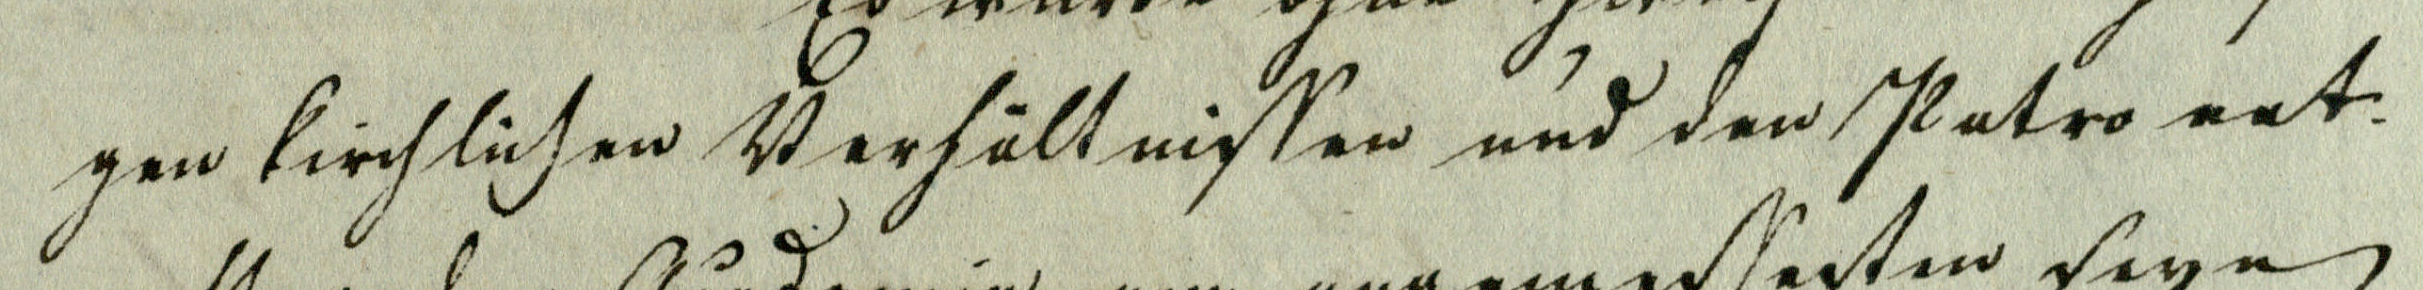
gen kirchlichen Verhältnissen und den Patronat
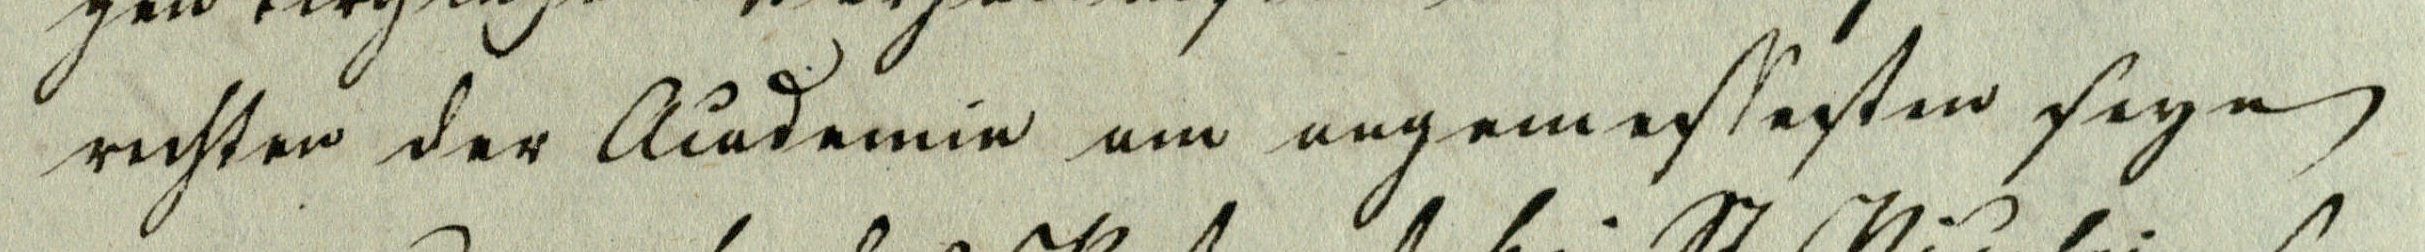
rechten der Academie am angemessensten seyn
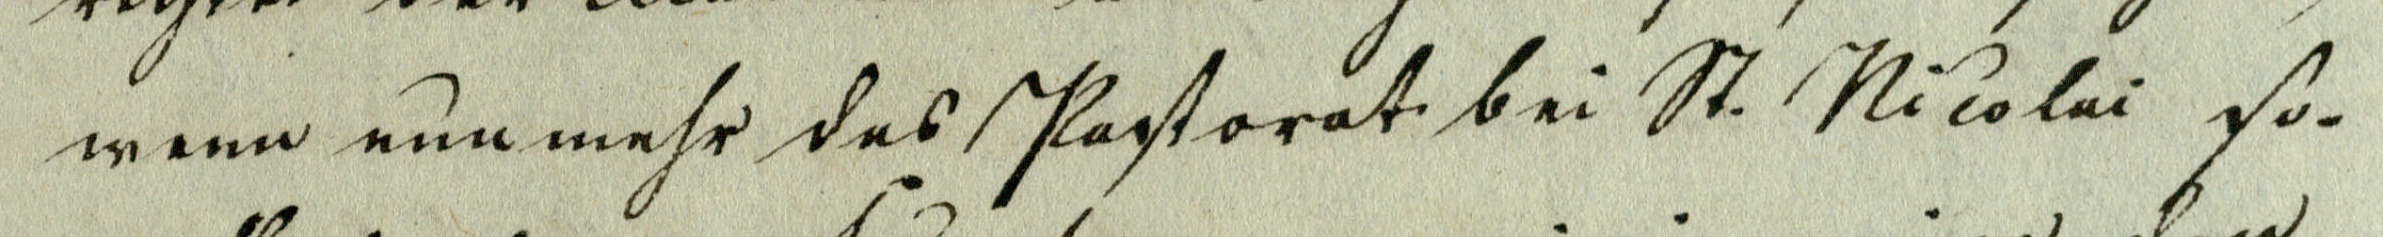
wenn nun mehr das Pastorat bei St. Nicolai so¬
